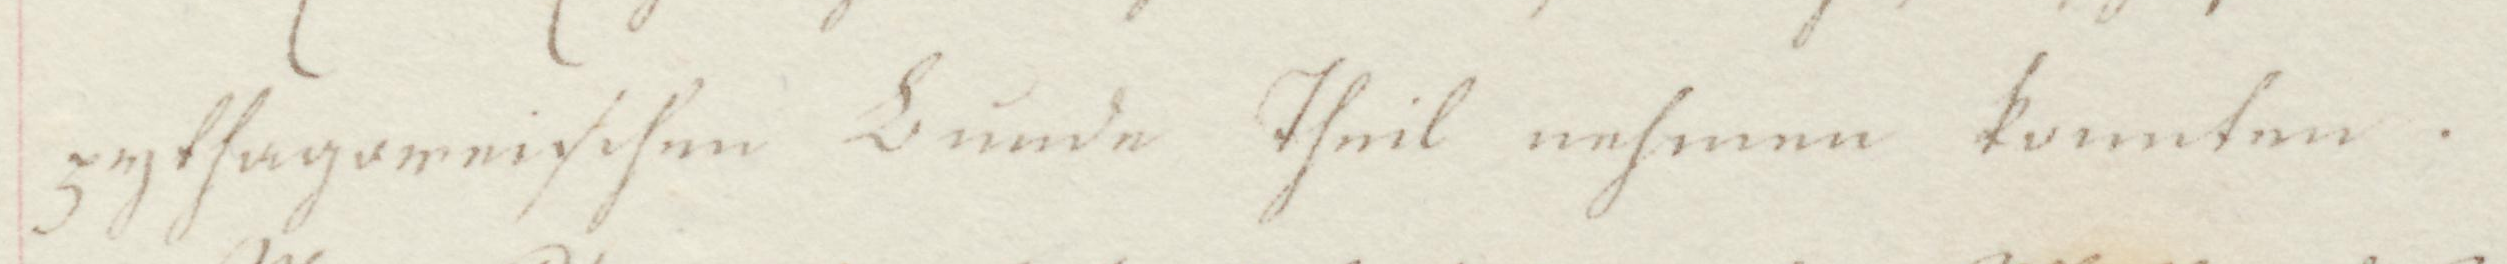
pythagoreischen Bunde Theil nehmen konnten.
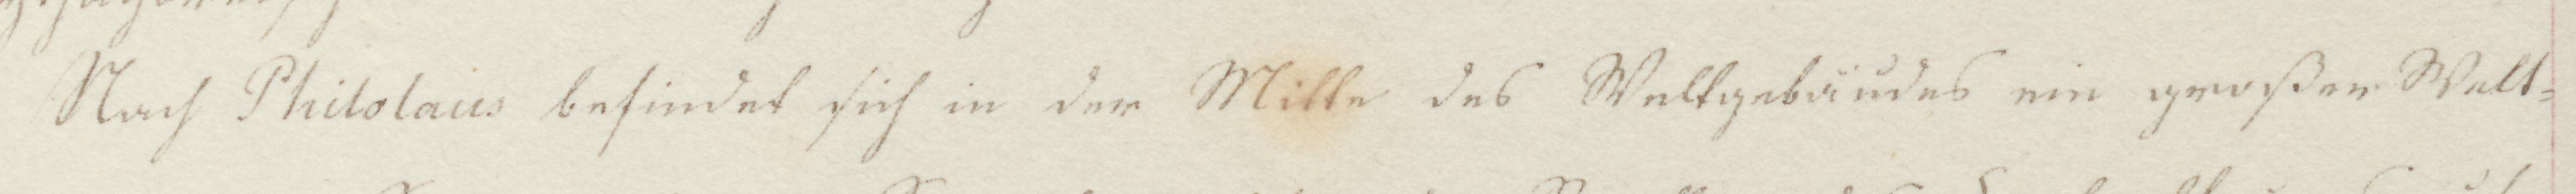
Nach Philolaus befindet sich in der Mitte des Weltgebäudes ein großer Welt-
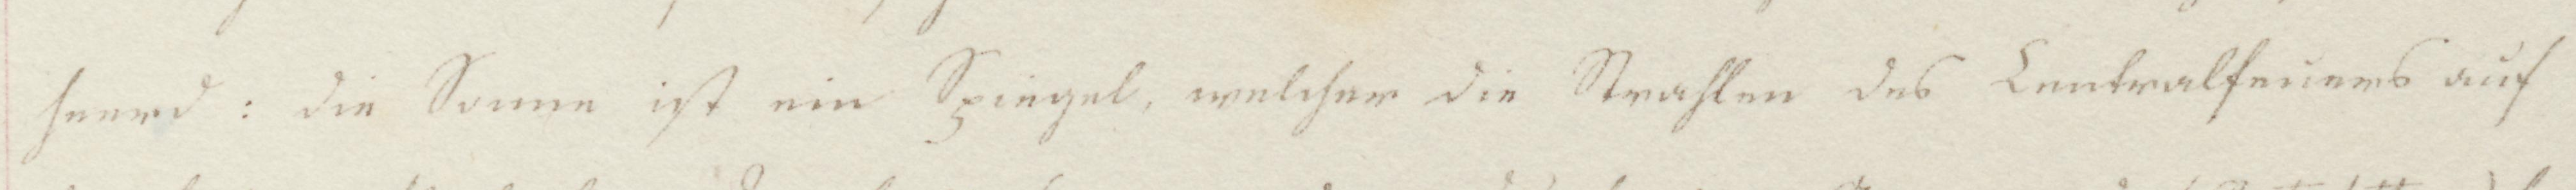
heerd: die Sonne ist ein Spiegel, welcher die Strahlen des Centralfeuers auf
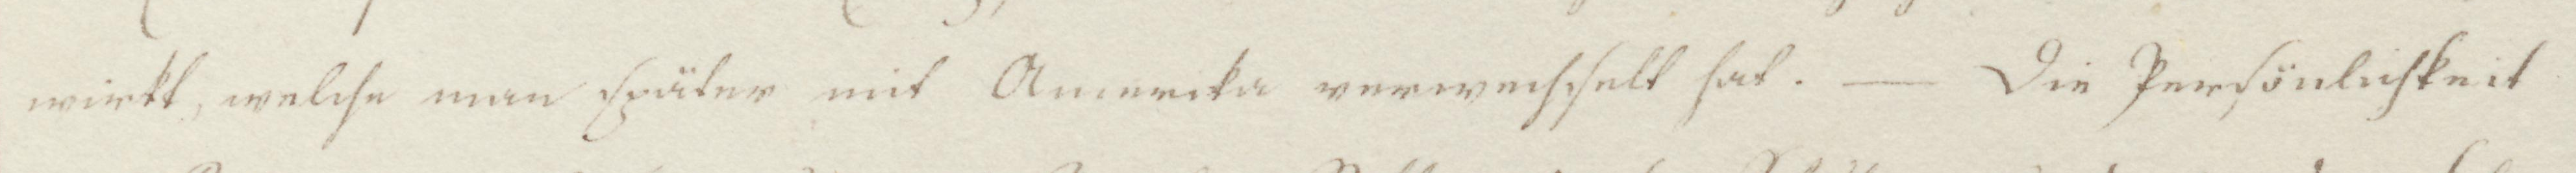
wirkt, welche man später mit Amerika verwechselt hat. – Die Persönlichkeit
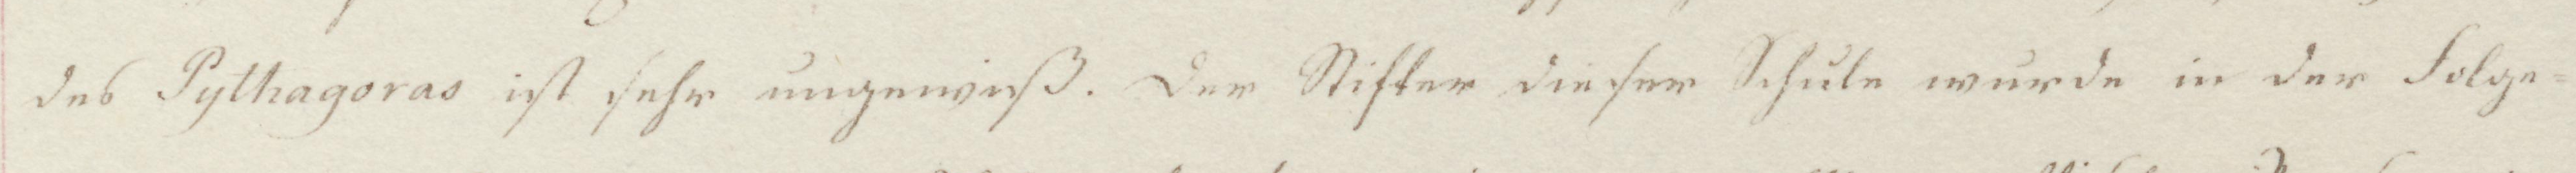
des Pythagoras ist sehr ungewiß. Der Stifter dieser Schule wurde in der Folge-
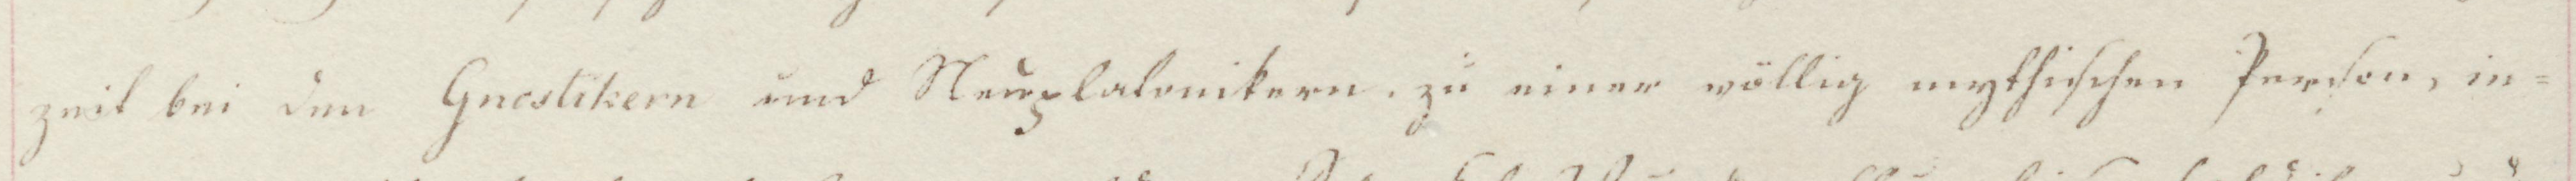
zeit bei den Gnostikern und Neuplatonikern, zu einer völlig mythischen Person, in-
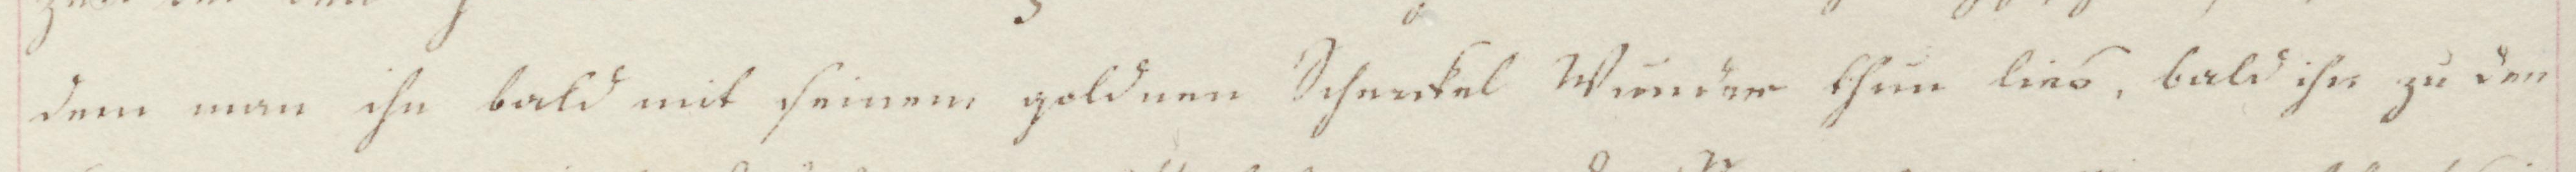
dem man ihn bald mit seinem goldnen Schenkel Wunder thun lies, bald ihn zu den
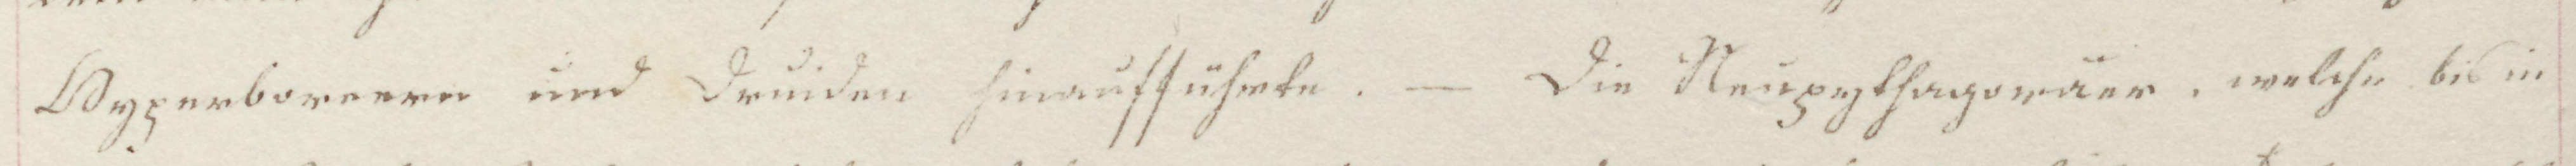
Hyperboreern und Druiden hinaufführte. – Die Neupythagoräer, welche bis in
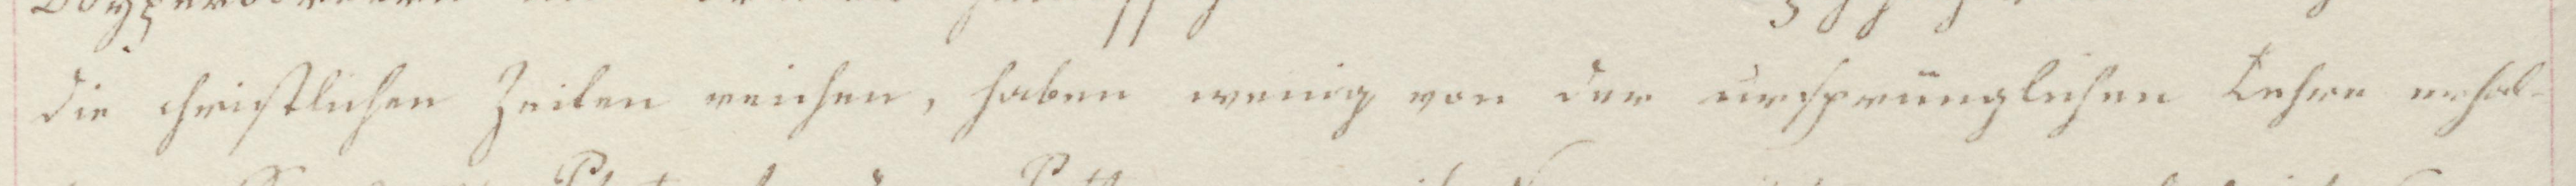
die christlichen Zeiten reichen, haben wenig von der ursprünglichen Lehre erhal-
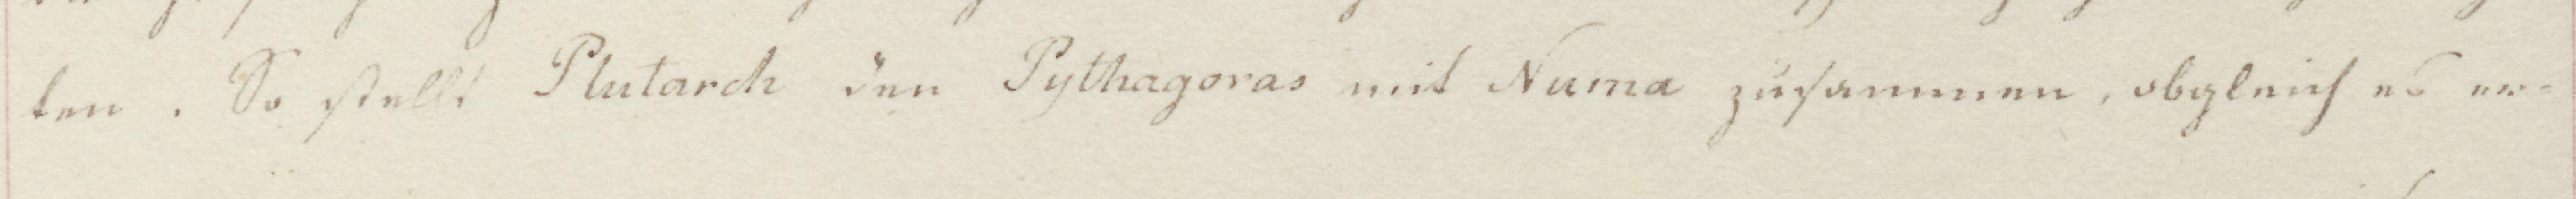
ten. So stellt Plutarch den Pythagoras mit Numa zusammen, obgleich es er-
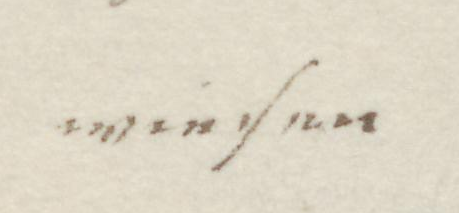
wiesen
